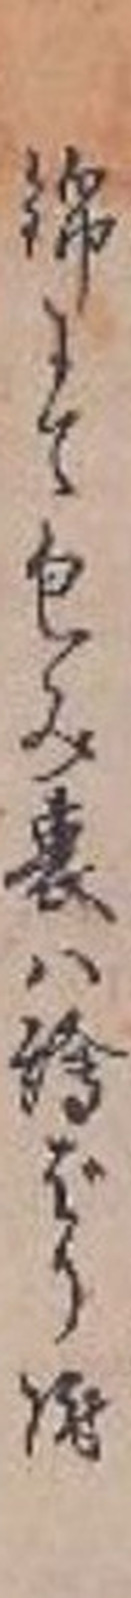錦にて包み裏は絵ばり附
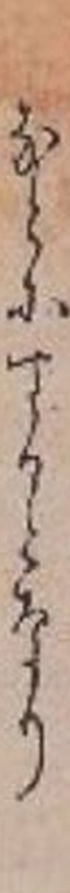などにするとなり
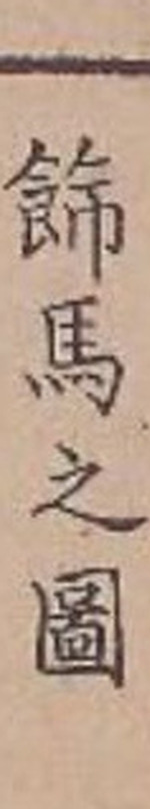飾馬之図
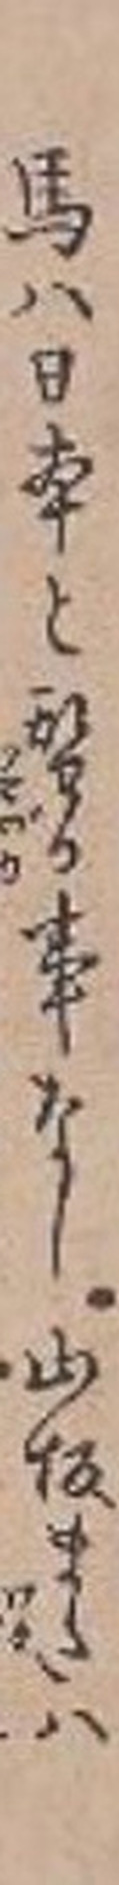馬は日本と替る事なし、山坂または
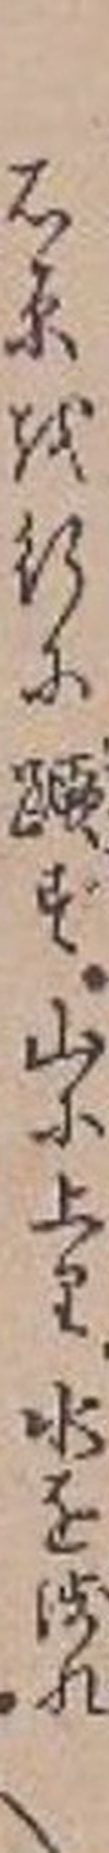石原を行に躓ず、山に上り、水を渉れ
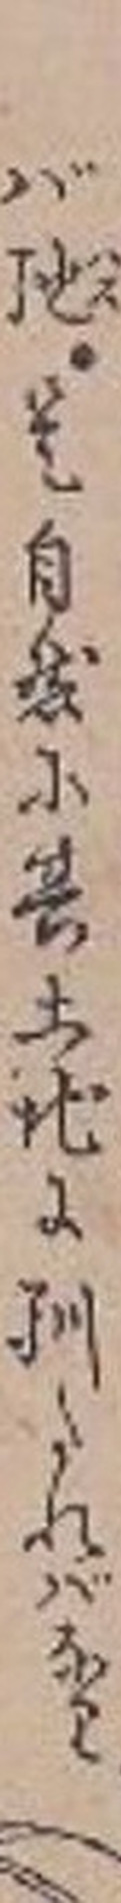ば馳、是自然に其土地に馴たればなり、
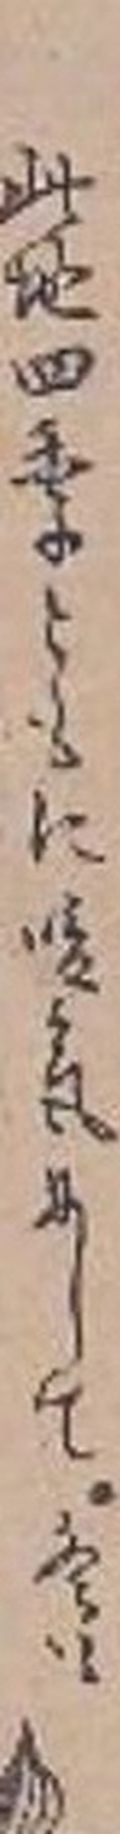此地四季ともに暖気にして、冬も
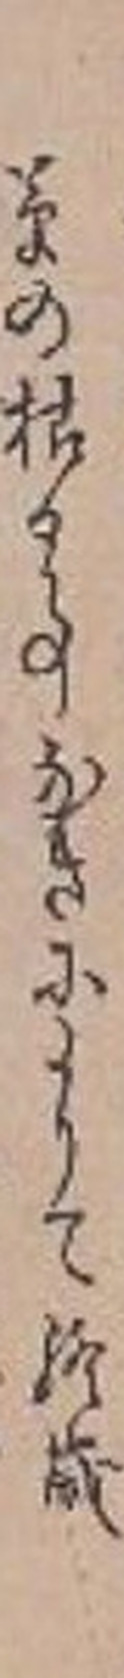草の枯る事なきによりて終歳
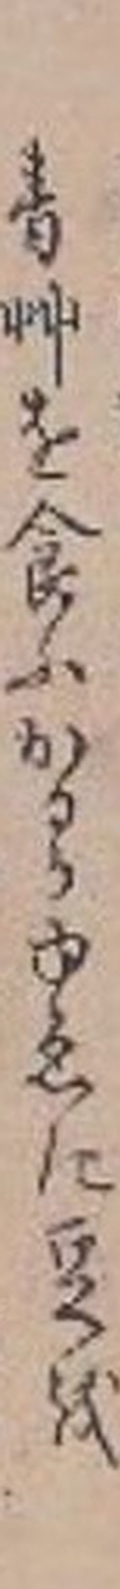青草を食ふかるかゆゑに豆を
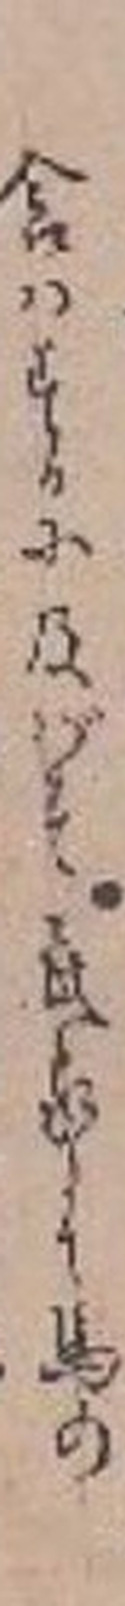食はするに及ばす、民家にて馬の
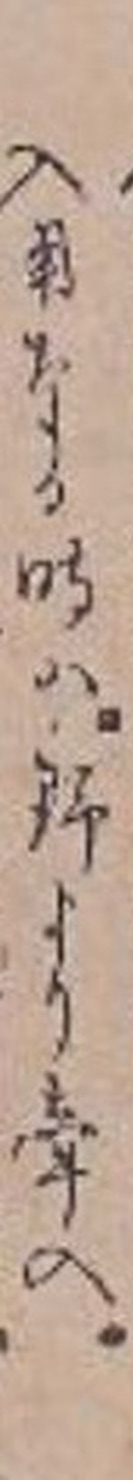入用なる時は、野より牽入、
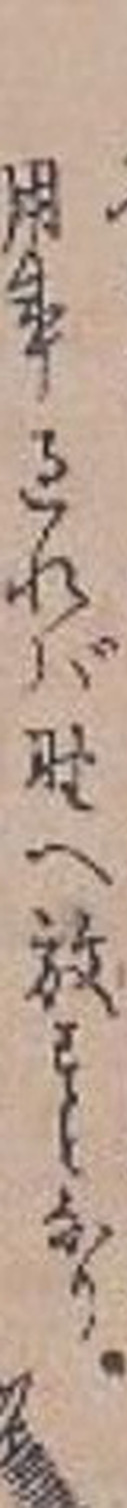用事過れば野へ放すとなり、
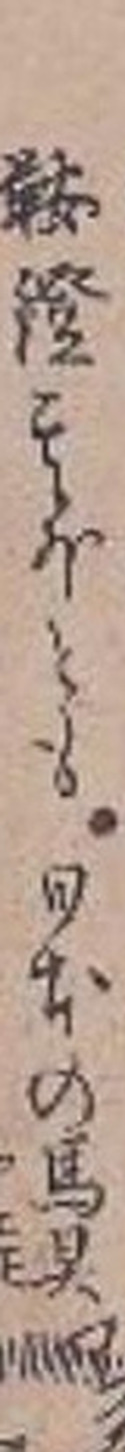鞍鐙其外とも、日本の馬具
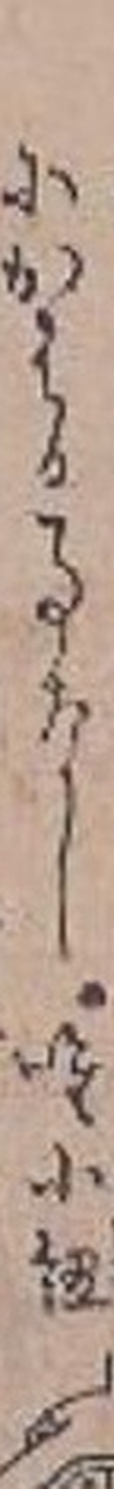にかはる事なし、唯小紐
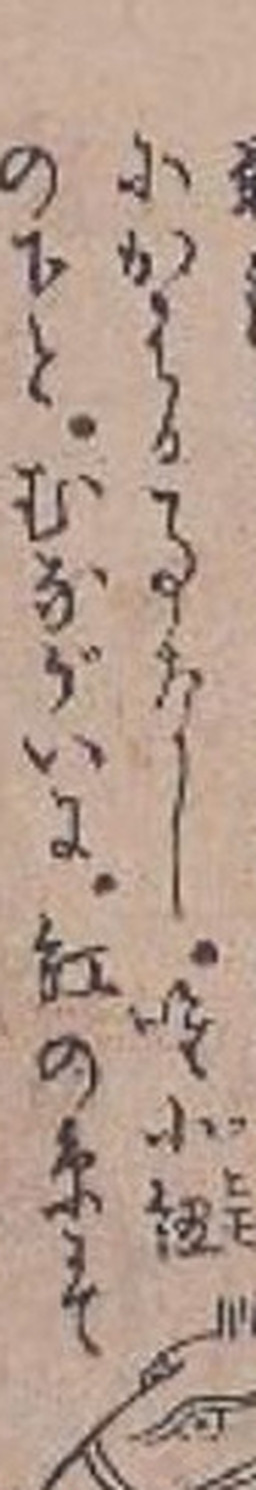の下と、むながいに、紅の糸にて
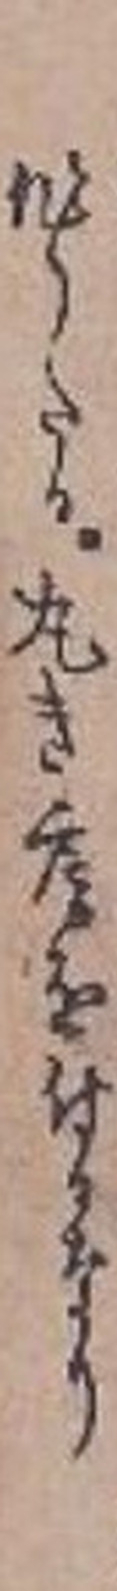作りたる、丸き房を付るなり
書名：琉球談
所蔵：University of the Ryukyus Library
